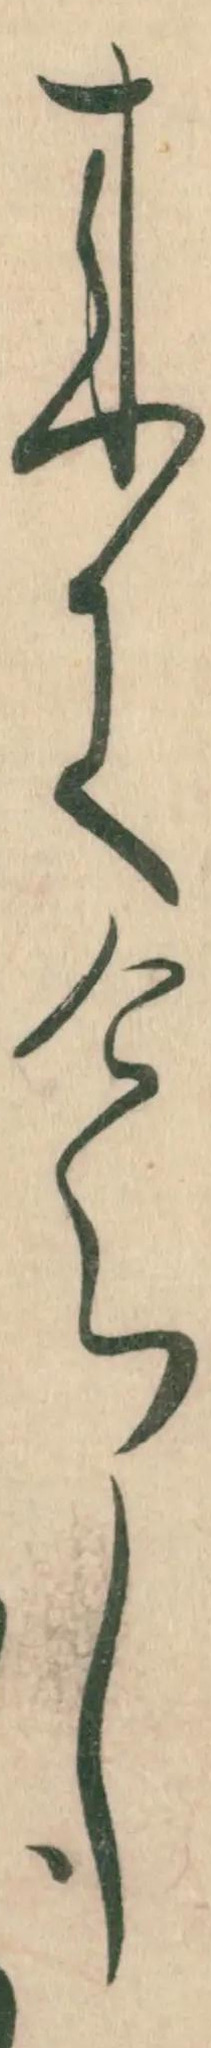来にけらし
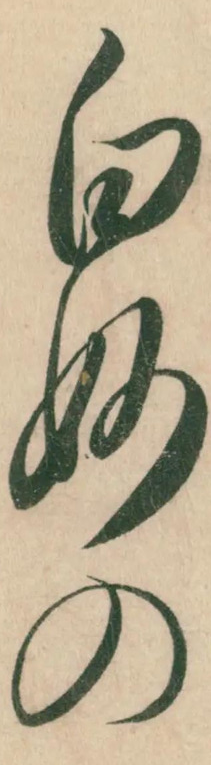白妙の
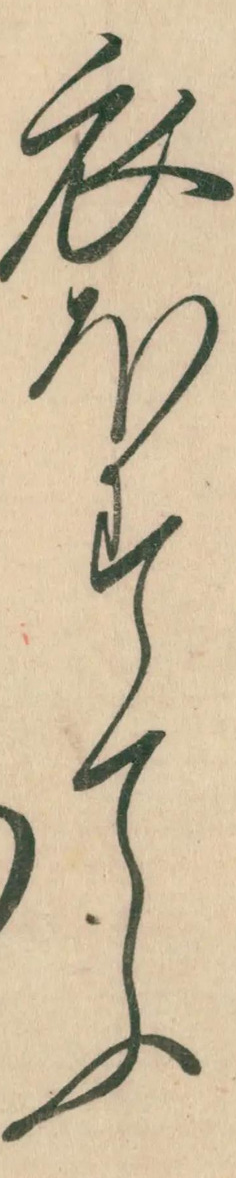衣ほすてふ
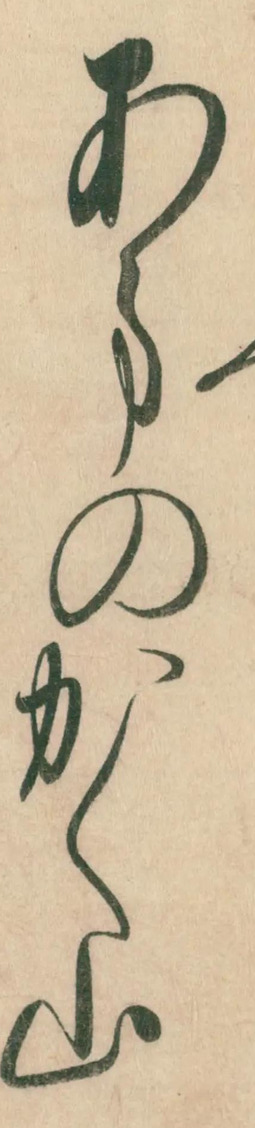あまのかく山

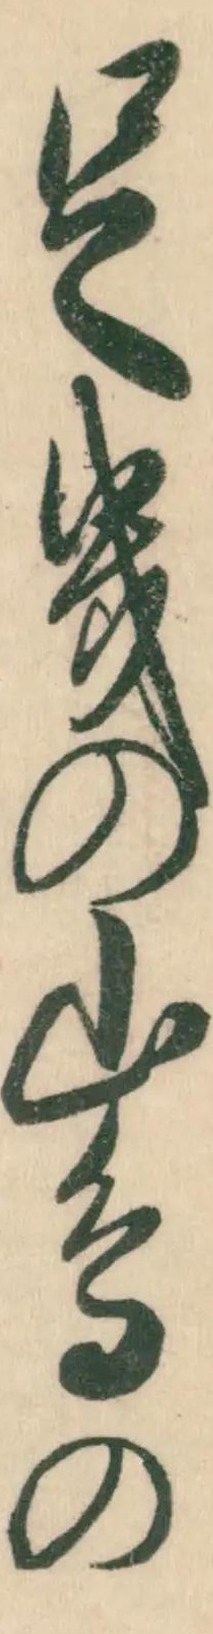足曳の山鳥の
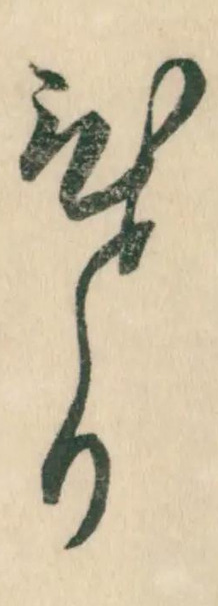ひとり
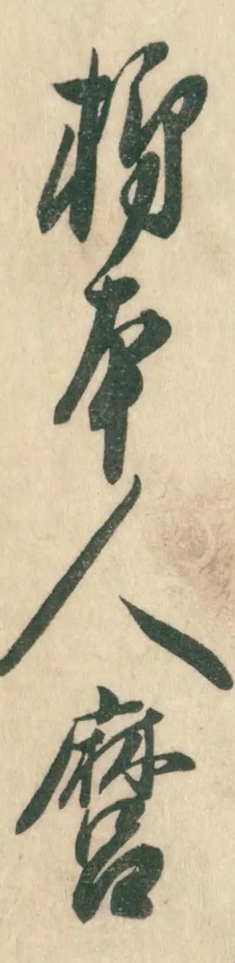柿本人麿

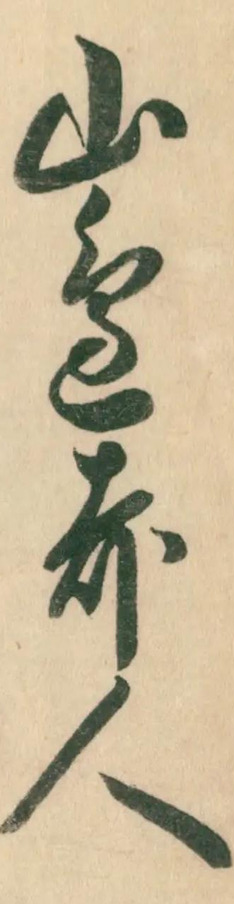山邊赤人
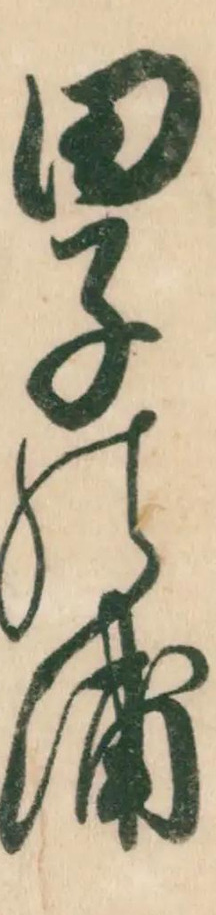田子の浦
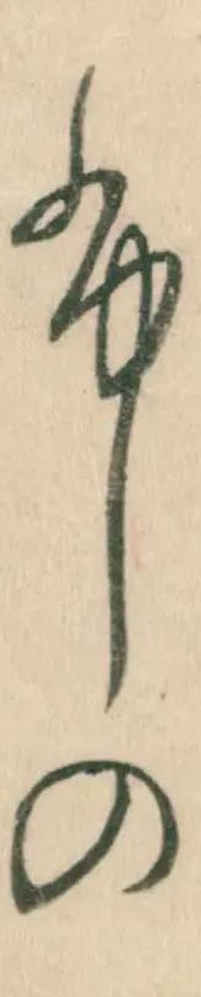ふしの
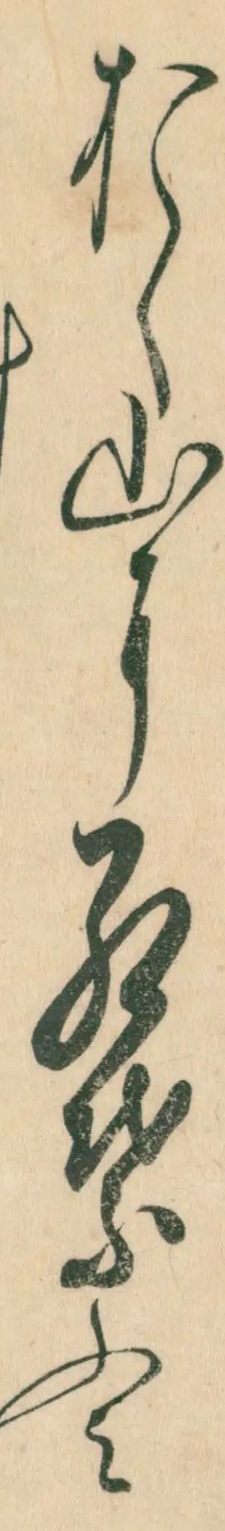おく山に紅葉ふみ
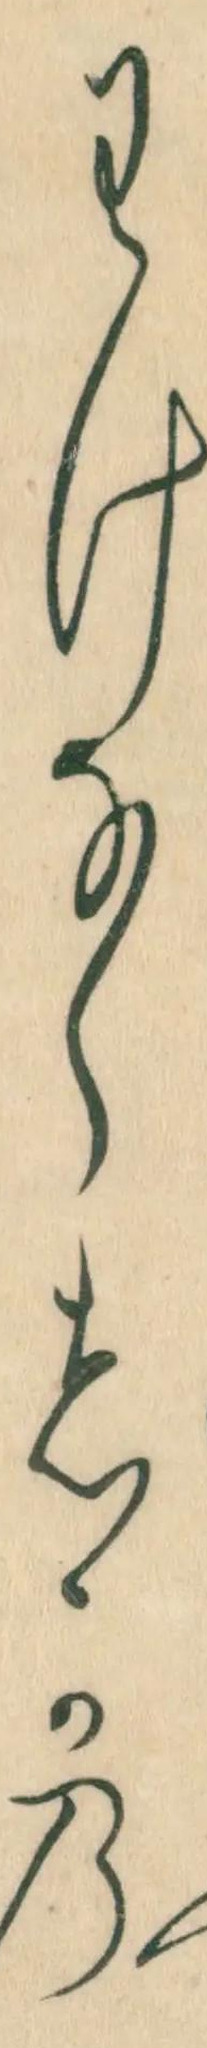わけなくしかの
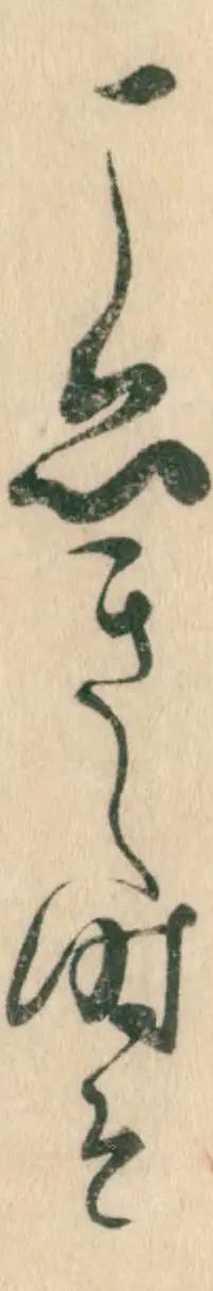こゑきく時そ
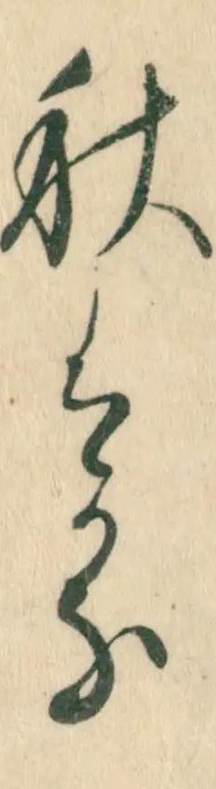秋はかな
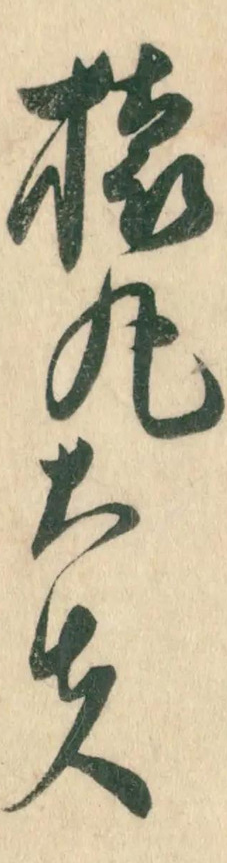猿丸大夫

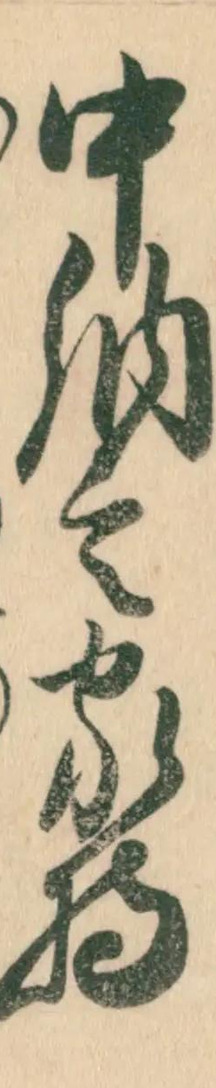中納言家持
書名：錦百人一首あつま織
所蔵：国立国会図書館 National Diet Library, JAPAN
